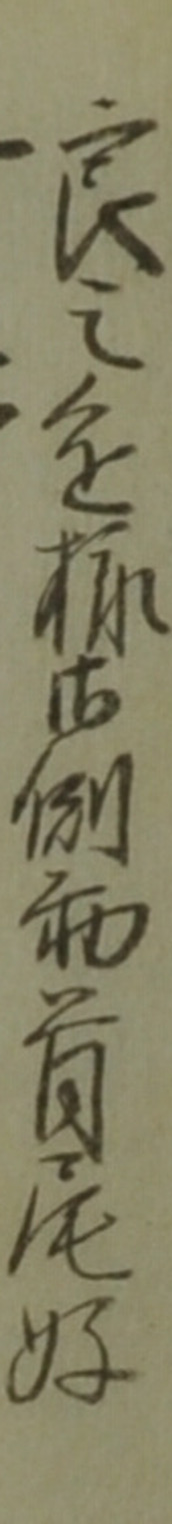良之進様御側勤首尾好
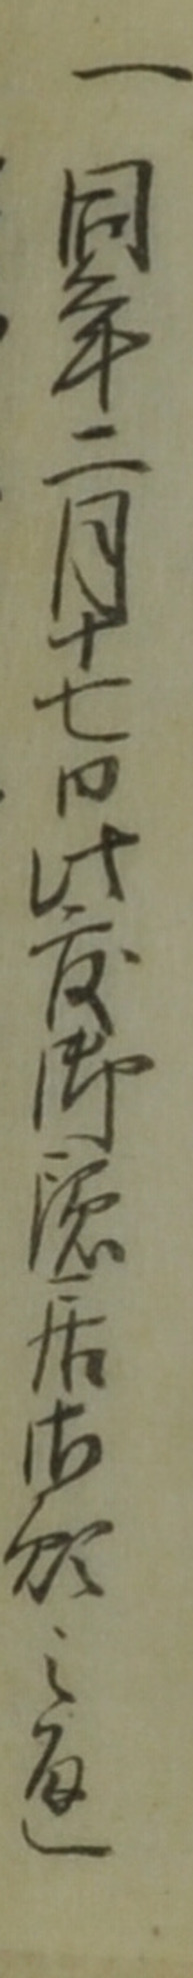一同年二月十七日此度御隠居御願之通
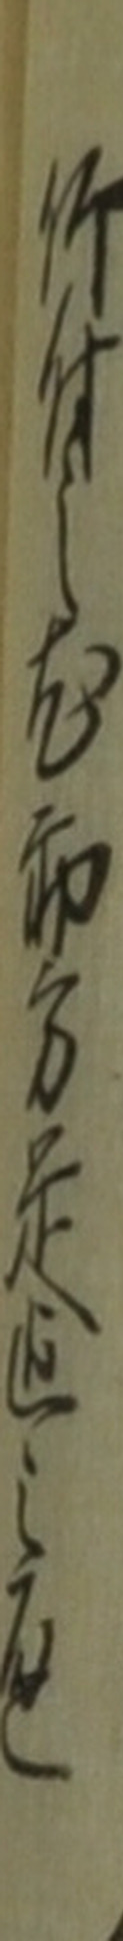仰付之尤勤方是迄之通
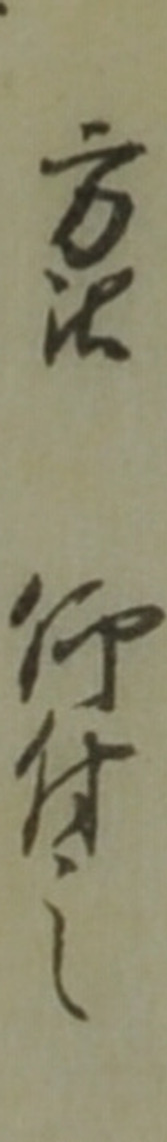方被仰付之
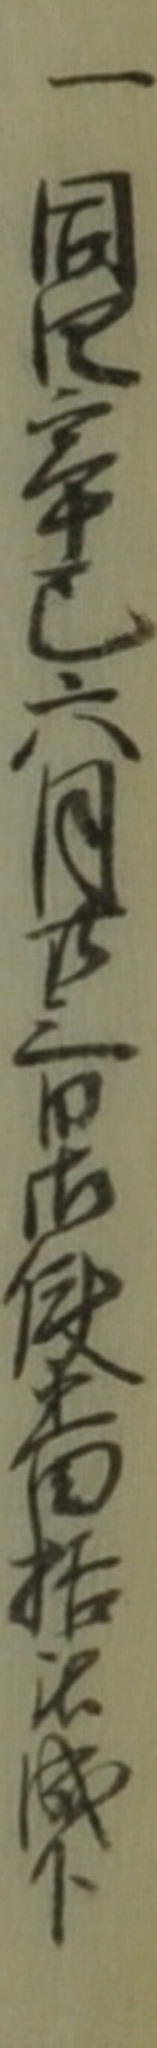一同四辛巳六月廿三日御使番格被成下
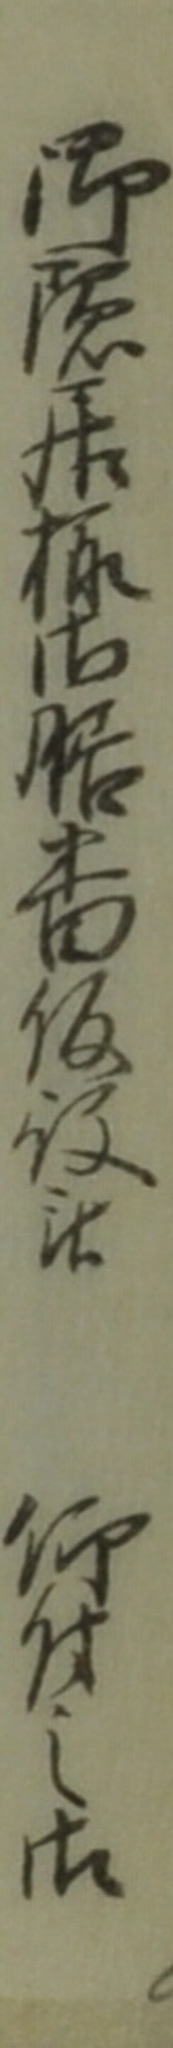御隠居様御膳番仮役被仰付之御
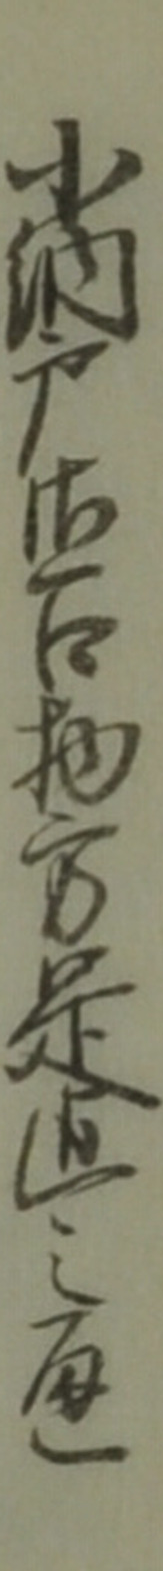小納戸御召物方是迄之通
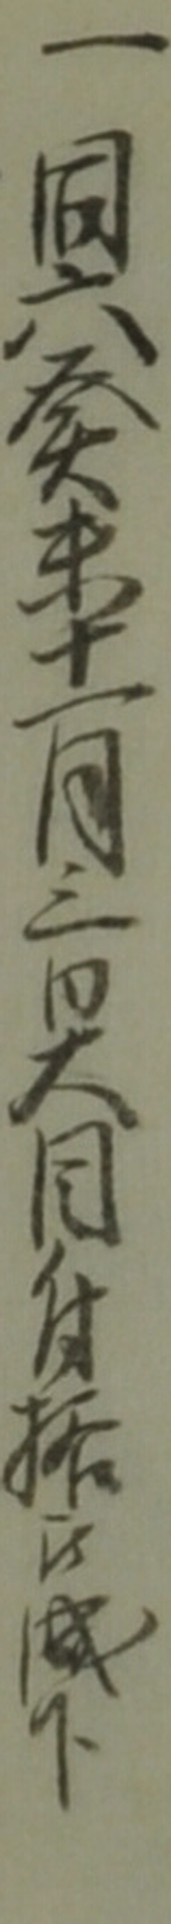一同六癸未十一月三日大目付格被成下
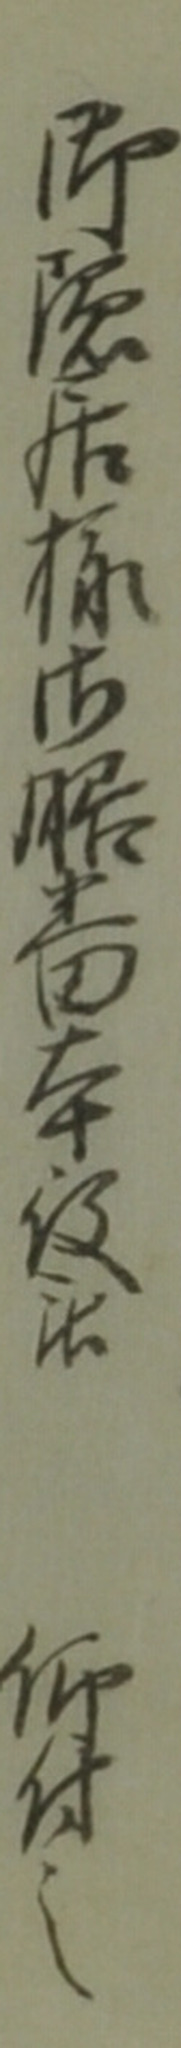御隠居様御膳番本役被仰付之
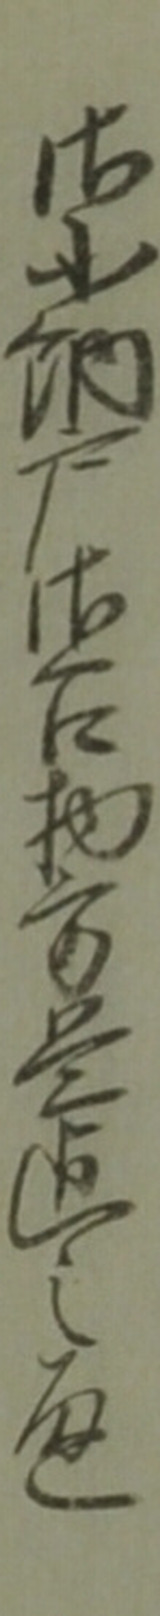御小納戸御召物方是迄之通
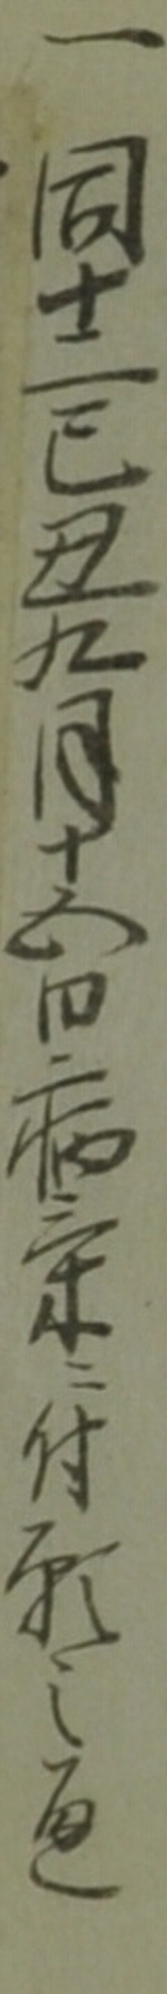一同十二己丑九月十五日病気ニ付願之通
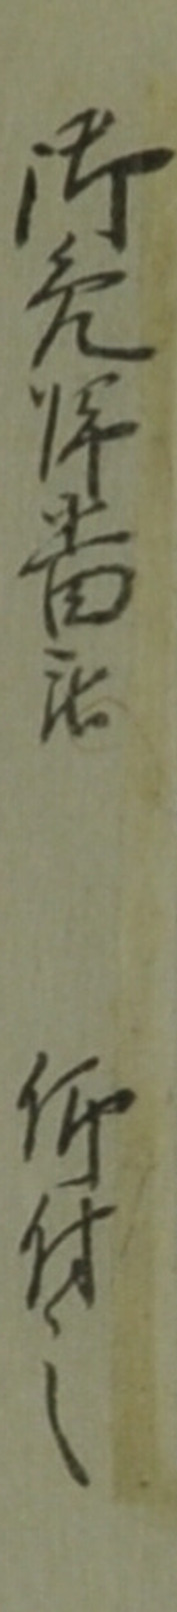御免帰番被仰付之
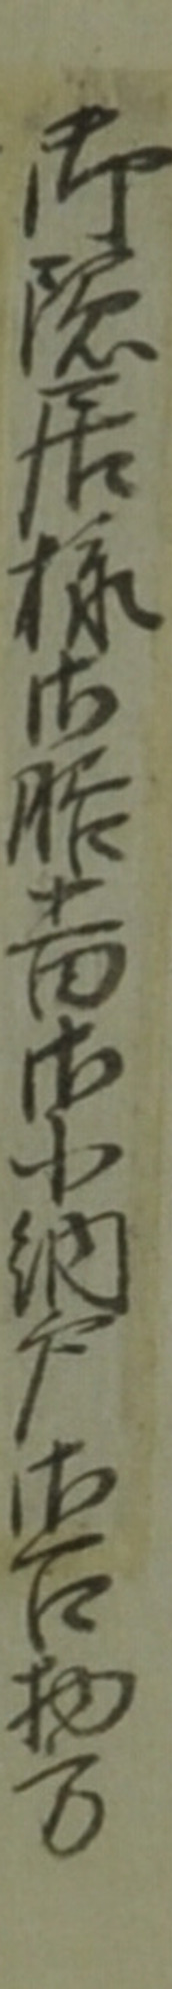御隠居様御膳番御小納戸御召物方
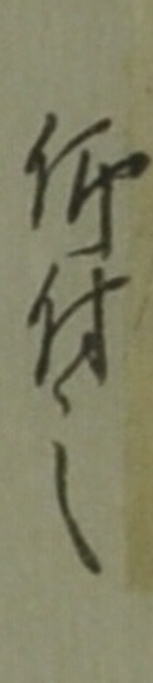仰付之
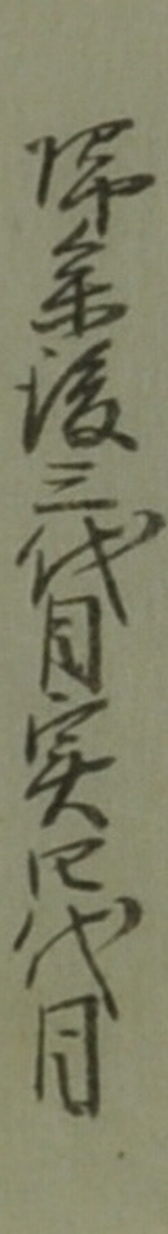帰参後三代目実四代目
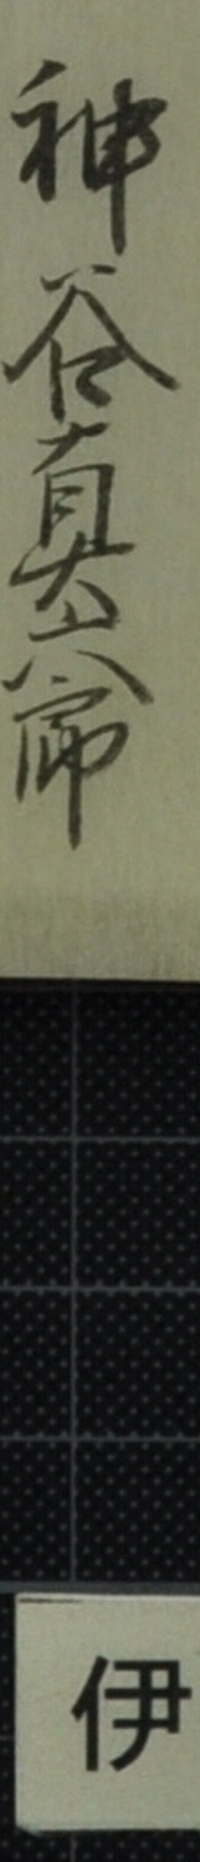神谷申真六郎
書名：諸御役代々録（五）
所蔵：伊那市立高遠町図書館・合同会社AMANE
